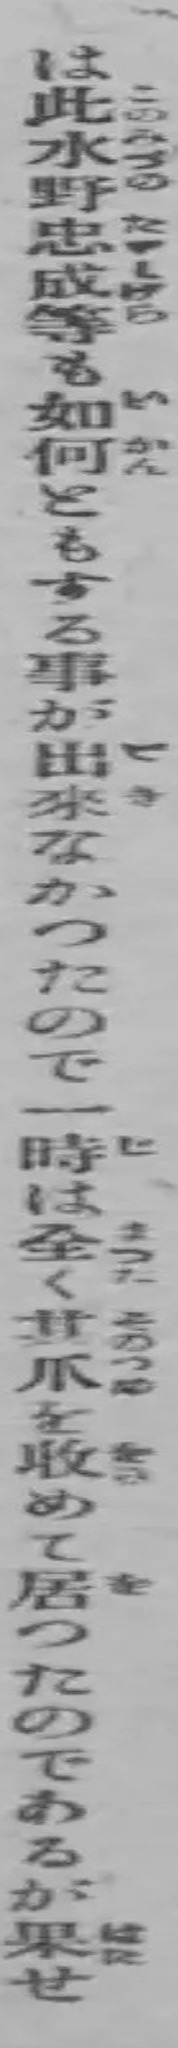は此水野忠成等も如何ともする事が出来なかつたので一時は全く其爪を収めて居つたのであるが果せ
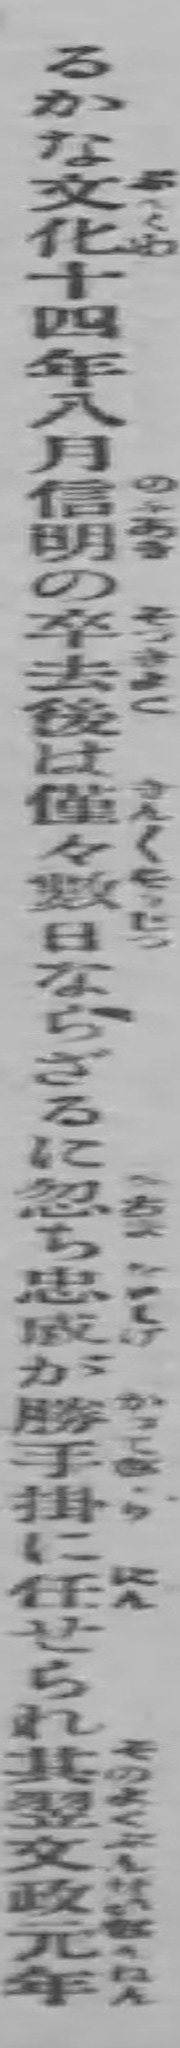るかな文化十四年八月信明の卒去後は僅々数日ならざるに忽ち忠成が勝手掛に任せられ其翌文政元年
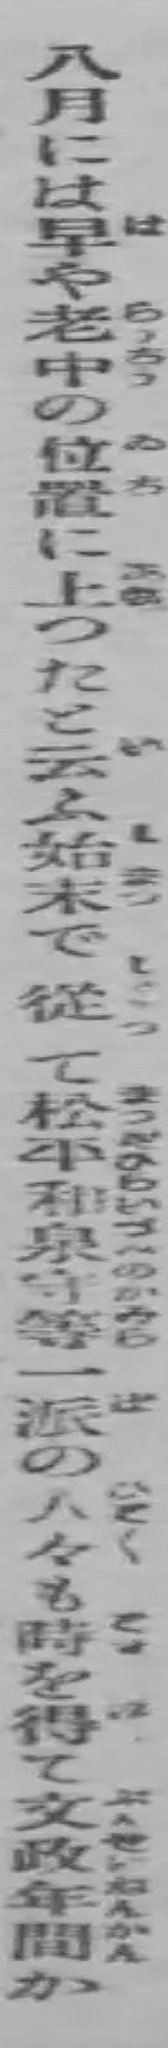八月には早や老中の位置に上つたと云ふ始末で従て松平和泉守等一派の人々も時を得て文政年間か
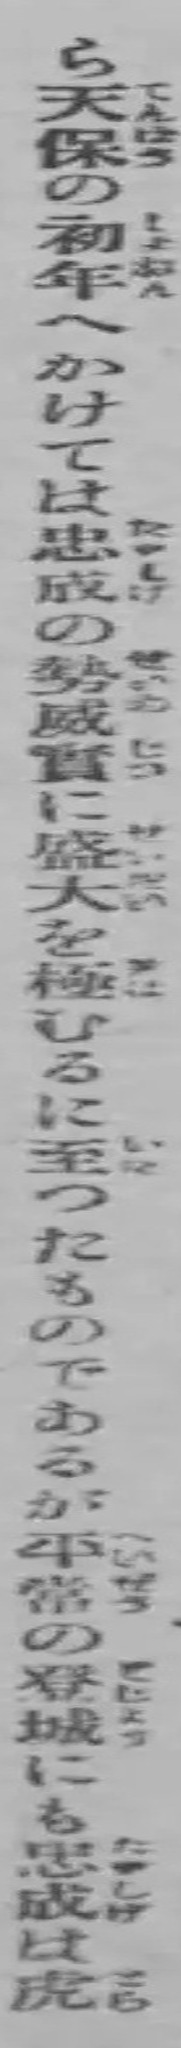ら天保の初年へかけては忠成の勢威実に盛大を極むるに至つたものであるが平常の登城にも忠成は虎
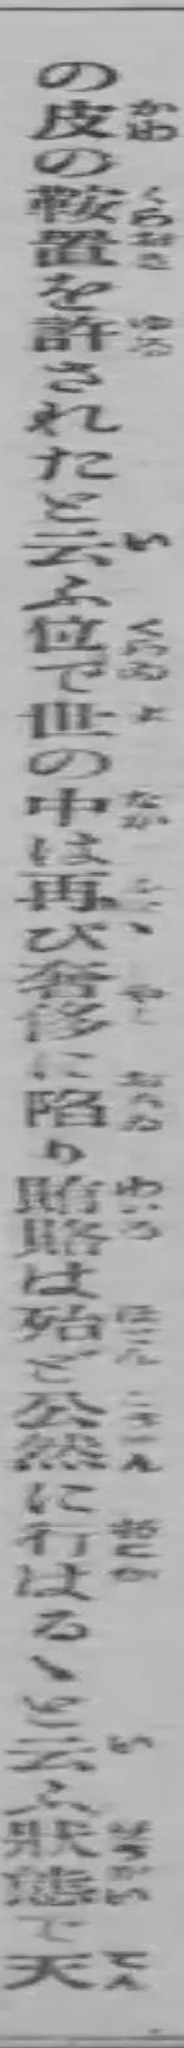の皮の鞍置を許されたと云ふ位で世の中は再び奢侈に陥り賄賂は殆ど公然に行はるゝと云ふ状態で天
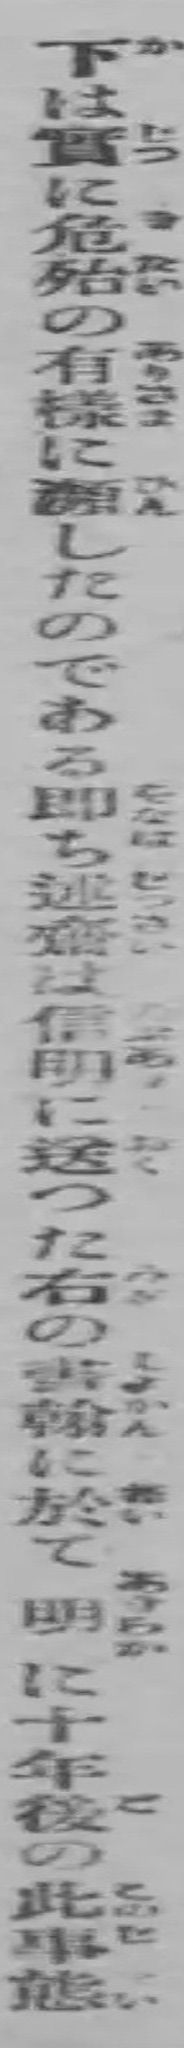下は実に危殆の有様に瀕したのである即ち述斉は信明に送つた右の書翰に於て明に十年後の此事態
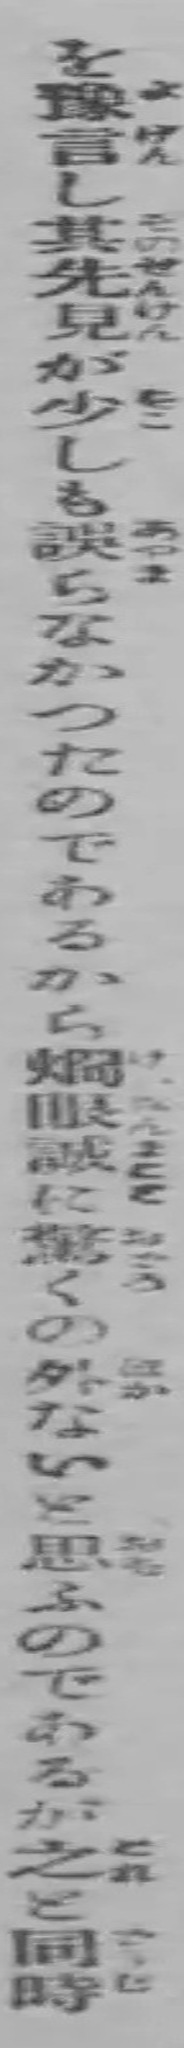述斉の予言を予言し其先見が少しも誤らなかつたのであるから炯眼誠に驚くの外ないと思ふのであるが之と同時
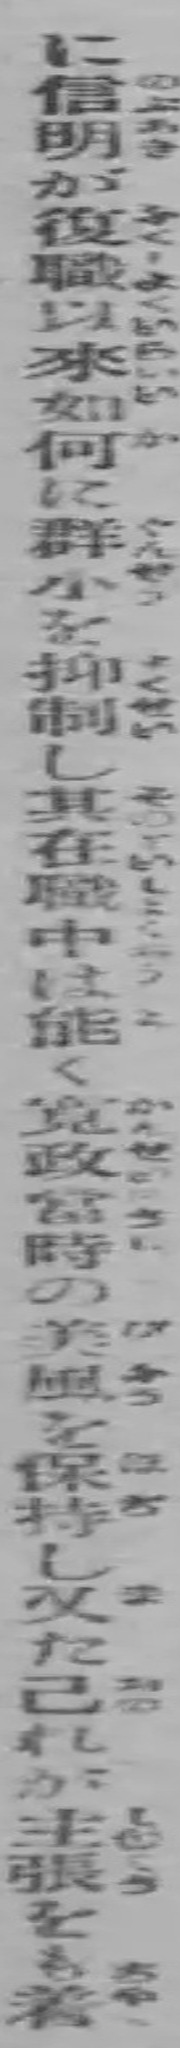に信明が復職以来如何に群小を抑制し其在職中は能く寛政当時の美風を保持し又た己れが主張をも着

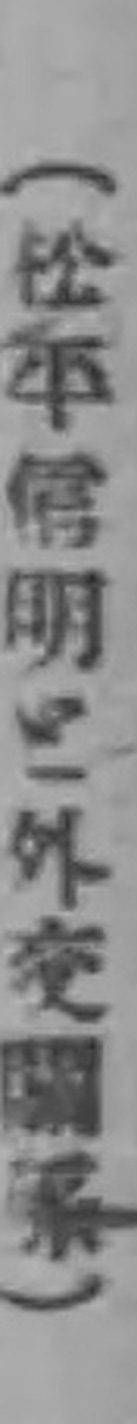⦿松平信明と外交関係
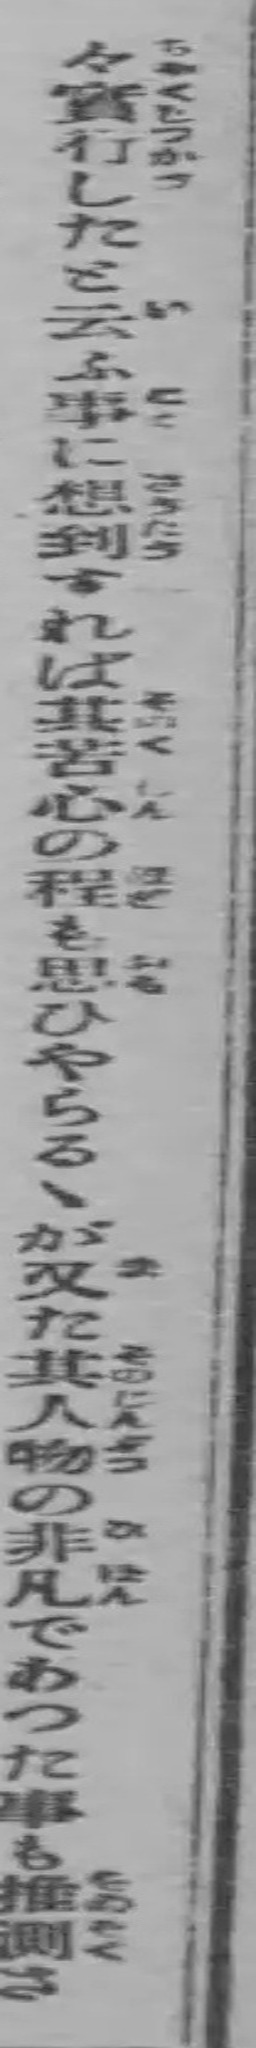着実行したと云ふ事に想到すれば其苦心の程も思ひやらるゝが又た其人物の非凡であつた事も推測さ
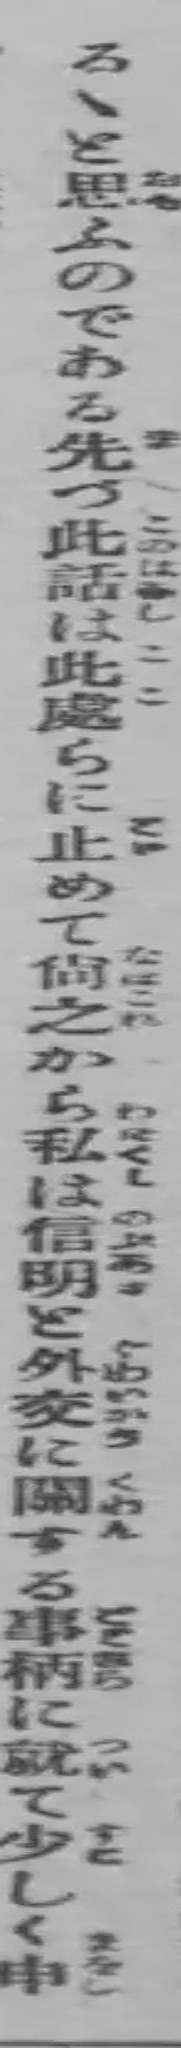るゝと思ふのである先づ此話は此処らに止めて尚之から私は信明と外交に関する事柄に就て少しく申
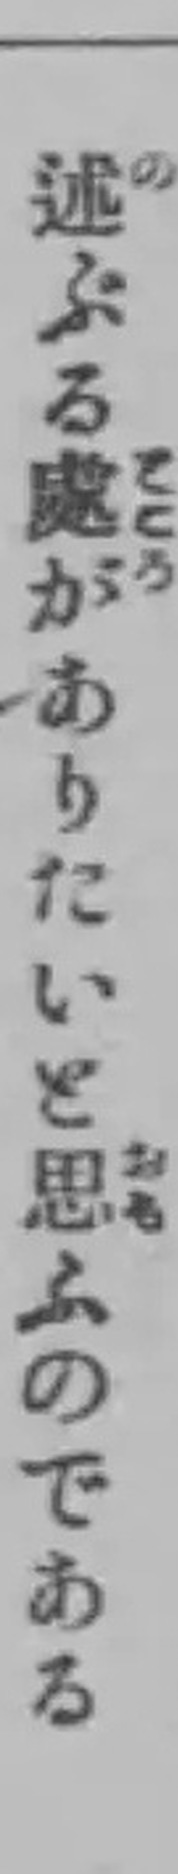述ぶる処がありたいと思ふのである
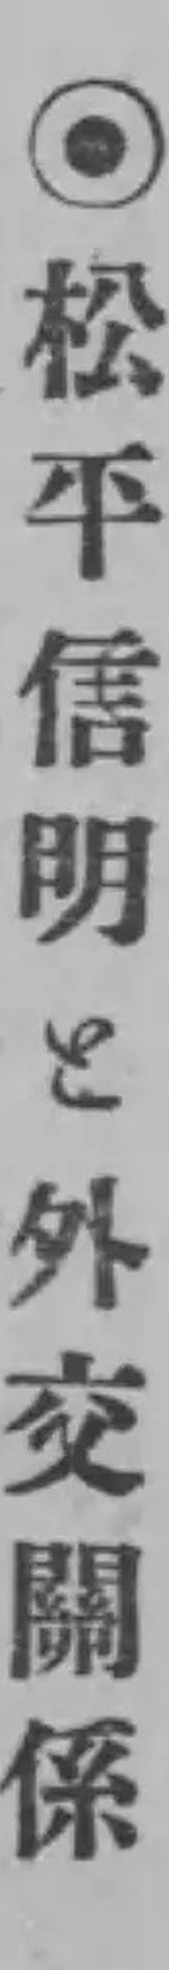⦿松平信明と外交関係
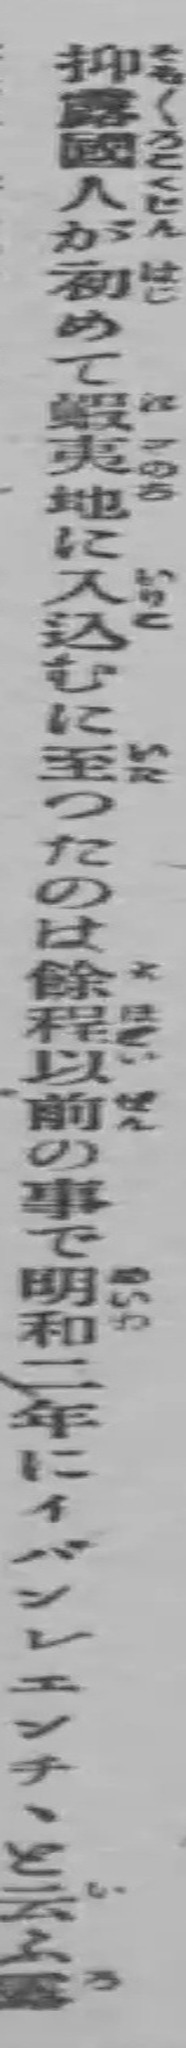抑露国人が初めて蝦夷地に入込むに至つたのは余程以前の事で明和二年にイバンレエンチゝと云ふ露
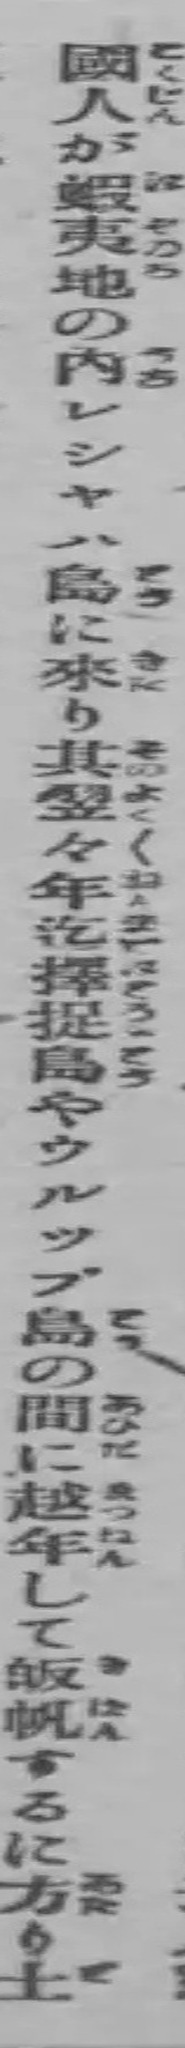国人が蝦夷地の内レシヤハ島に来り其翌々年迄択捉島やウルツプ島の間に越年して皈帆するに方り土
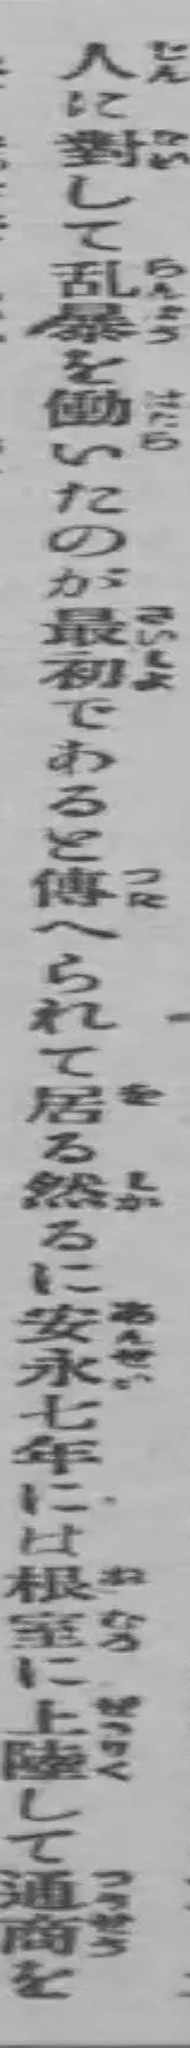人に対して乱暴を働いたのが最初であると伝へられて居る然るに安永七年には根室に上陸して通商を
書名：豊橋市史談
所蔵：国立国会図書館 National Diet Library, JAPAN
